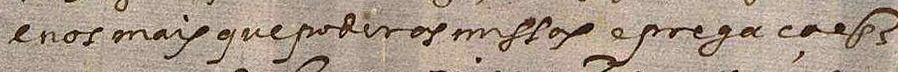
e nos mais que poder as missas e pregaçoes
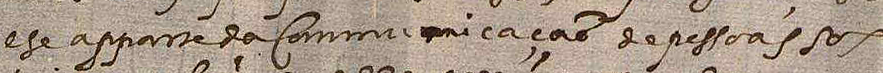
e se apparte da Communicaçaõ de pessoas sos
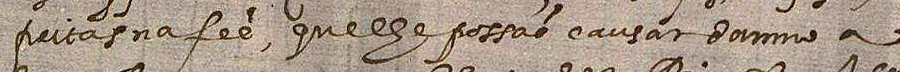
peitas na feé, que lhe possaõ causar damno a
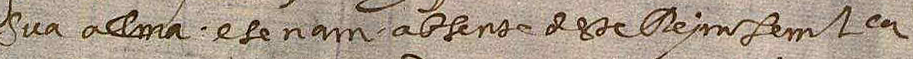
sua alma. e se nam absente deste Rejno sem Lça
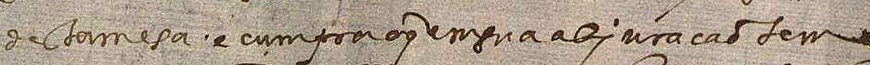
desta mesa. e cumpra o q̄ em sua abjuraçaõ tem
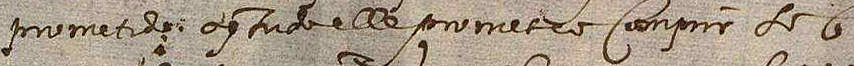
prometido. o q̄ tudo elle prometeo Comprir sob
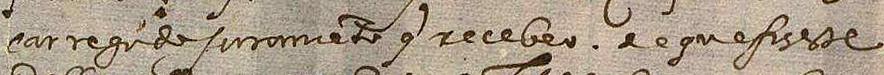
carrego do juramēto q̄ recebeo. de que fis este
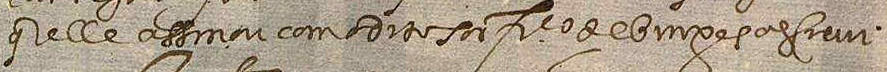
q̄ elle assinou com o dito sor̄ fr.co de bruges o esCreui
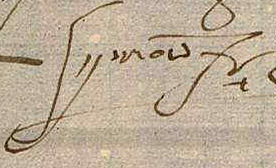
Sijmão frz
